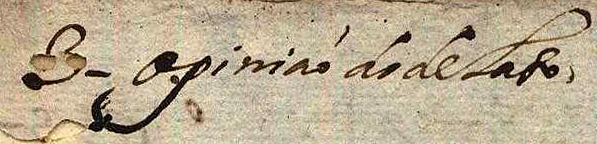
3- opinião do deLato.
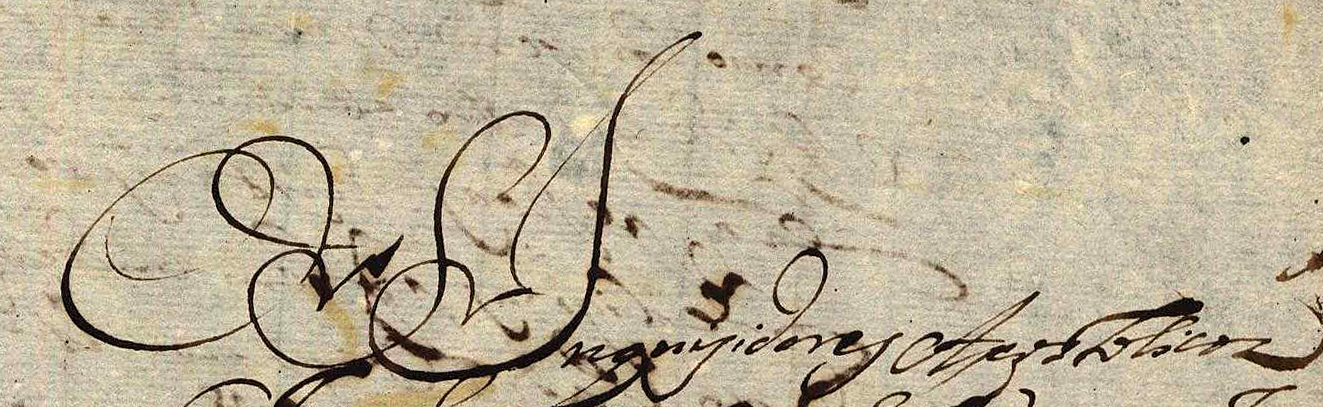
OS Inquisidores Apostolicoz
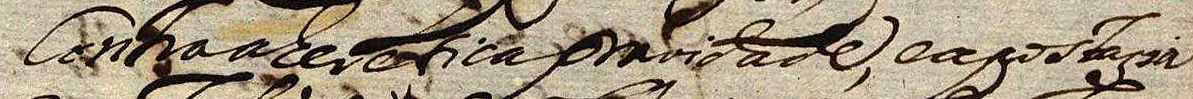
Contra a heretica pravidade, e apostazia
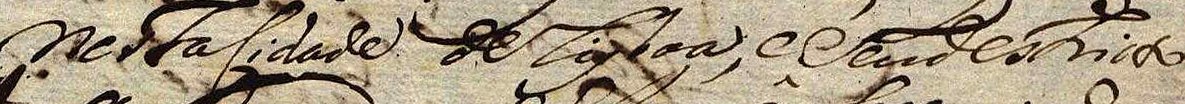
nesta Cidade de Lisboa, e seu destricto
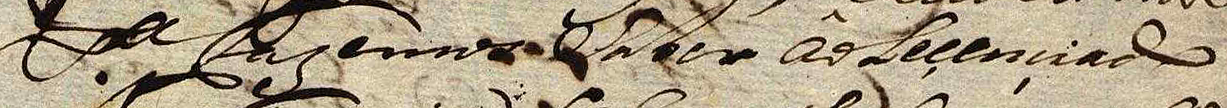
&a fazemos Saber ao Lecenciado
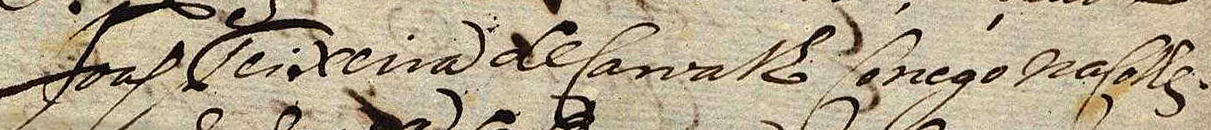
Joaõ Teixeira de Carvalho Conego na Colle
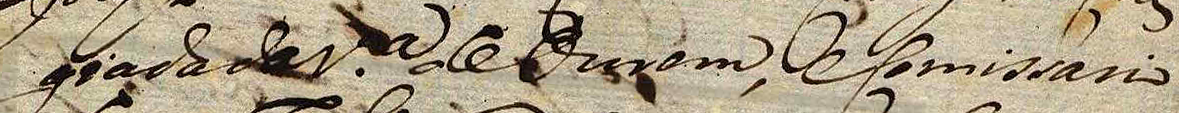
giada da V.a de Ourem, e Comissario
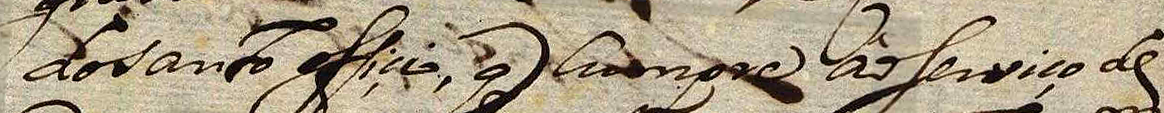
do santo officio, q̄ Cumpre ao serviço de
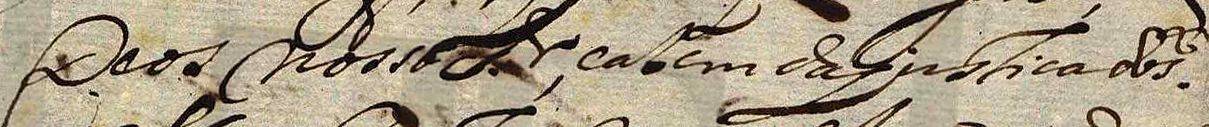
Deos nosso s.r, e a bem da justiça do s.to
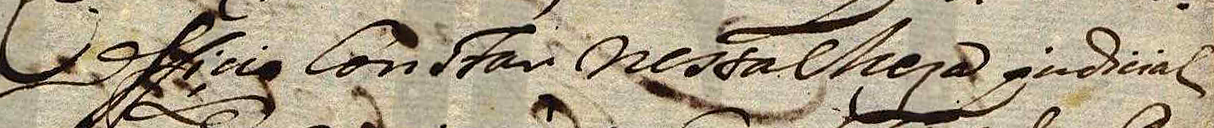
officio Constar nesta Meza judicial
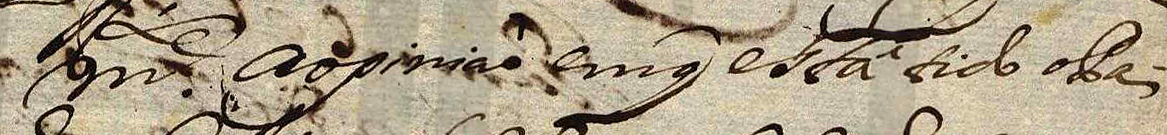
m.te a opiniaõ em q̄ está tido o Pa
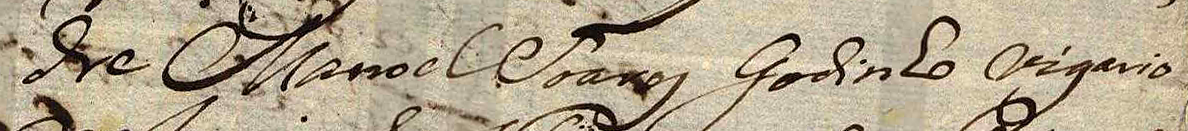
dre Manoel Soares Godinho Vigario
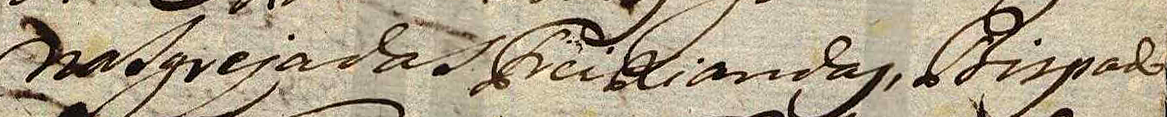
na Igreja das Freixiandas, Bispado
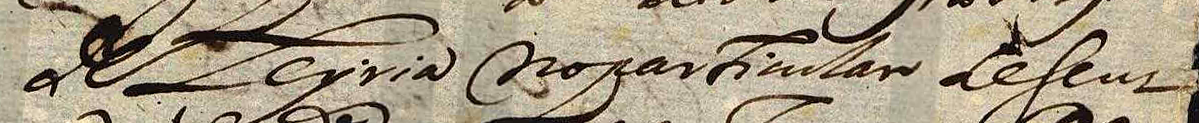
de Leyria no particular de seus
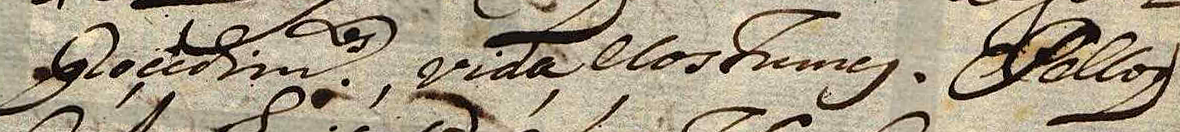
pRocedim.tos vida e costumes. Pello q̄
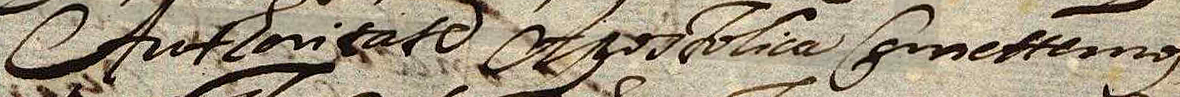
Authoritate Apostolica Comettemos
